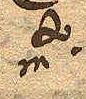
mto.
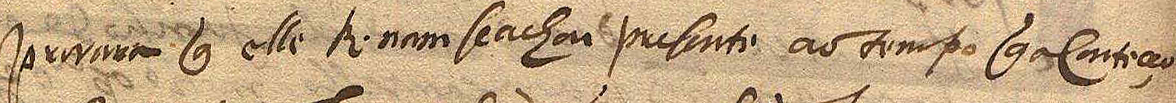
Provara q̄ elle R. nam se achou presente ao tempo q̄ aConteceo
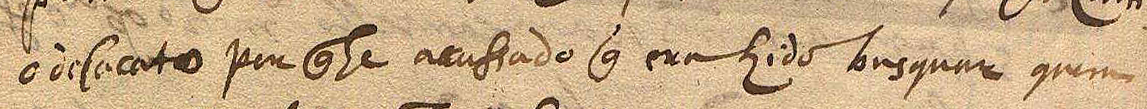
o desacato por q̄ he accussado q̄ era hido busquar quem
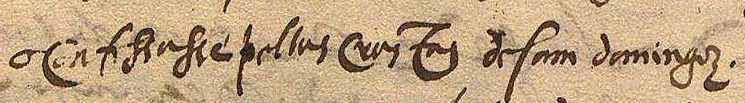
o Confessasse pellas Crastas de sam domingos.
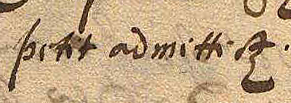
petit admitti ct.
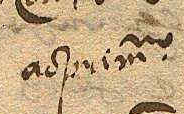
ao prim.ro
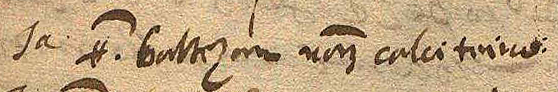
Ja item baltezam rōiz calciteiro.
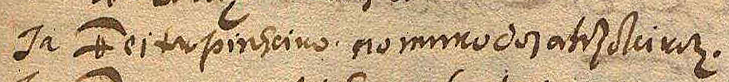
Ja item eitor pinheiro. no muro dos atezoleiros.
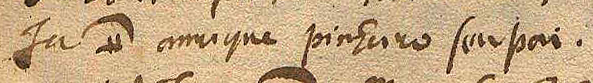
Ja item anrique pinheiro seu pai.
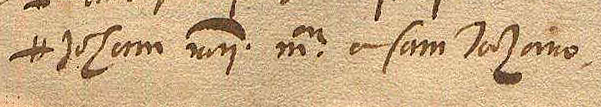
item Joham rōiz. mor. a samtozoiro
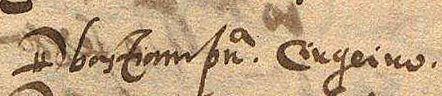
item bastiam pra. Cirgeiro.
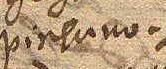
pinheiro.
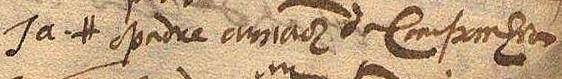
Ja item o padre cristiaõ da Companhia
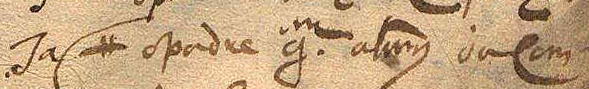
Ja item o padre gar. alūrz da Com
